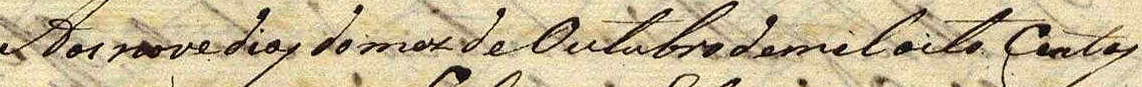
Aos nove dias do mez de Outubro de mil oitocentos
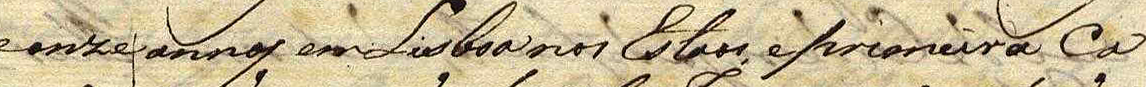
e onze annos em Lisboa nos Estaos e primeira Ca
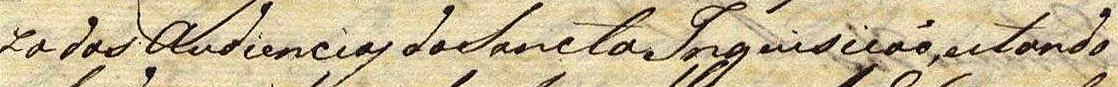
za das Audiencias da Sancta Inquisiçaõ, estando
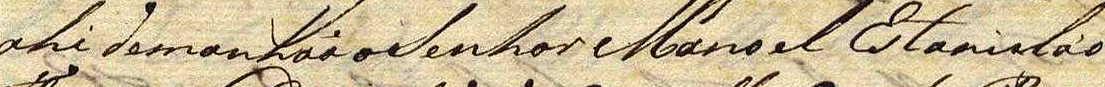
ahi de manhaa o Senhor Manoel Estanislao
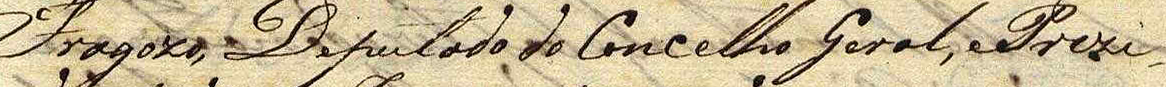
Fragozo, Deputado do Concelho Geral, e Prezi
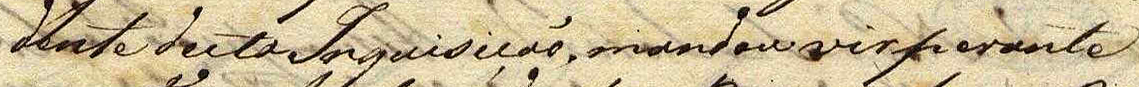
dente desta Inquisiçaõ, mandou vir perante
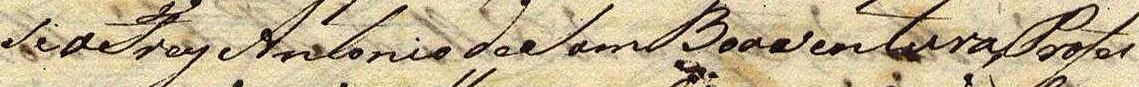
si a Frey Antonio de Sam Boaventura, Profes
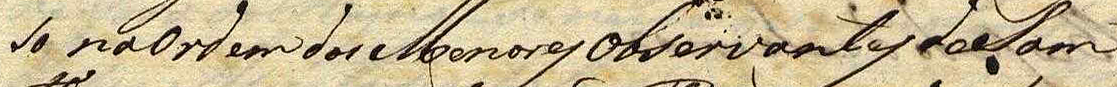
so na Ordem dos Menores Observantes de Sam
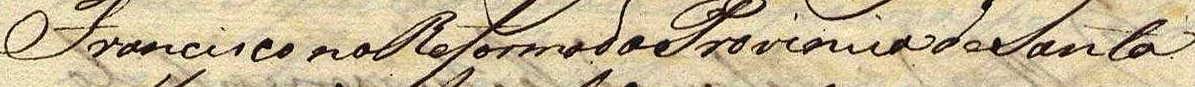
Francisco na Reformada Provincia de Santa
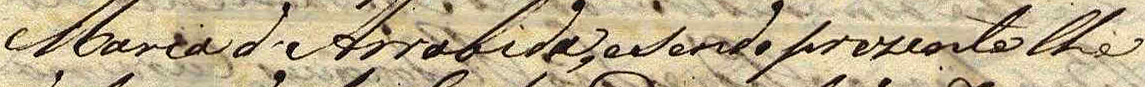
Maria d'Arrabida, e sendo prezente lhe
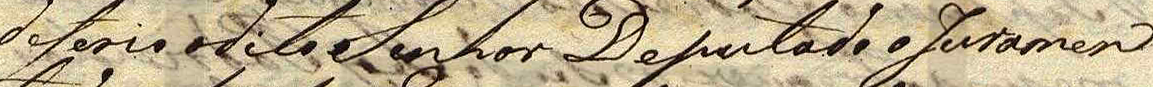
deferio o dito Senhor Deputado o Juramen
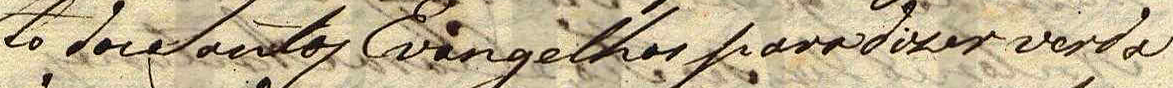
to dos Santos Evangelhos para dizer verda
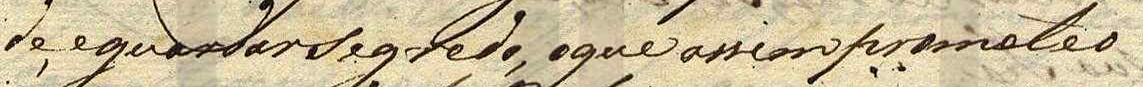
de e guardar segredo, o que assim prometeo
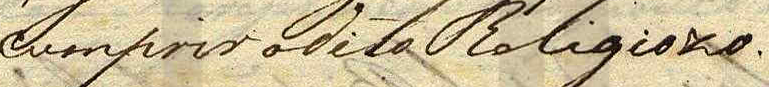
cumprir o dito Religiozo.
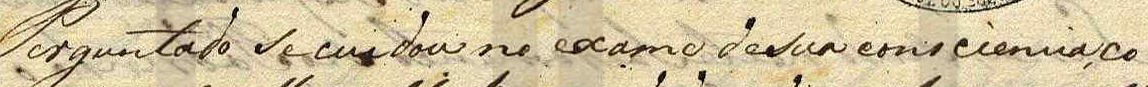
Perguntado se cuidou no exame de sua consciencia, co
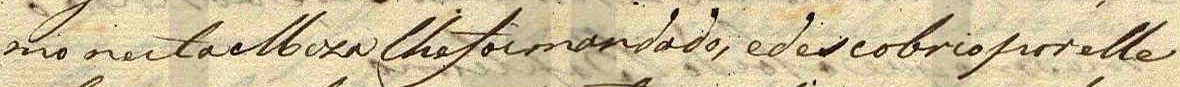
mo nesta Meza lhe foi mandado, e descobrio por elle
